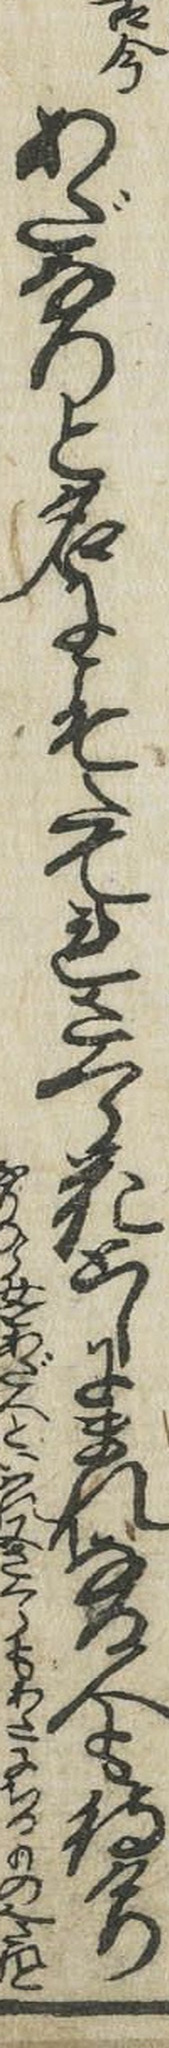古今あだなりと名にこそたてれさくら花としにまれなる人も待けり
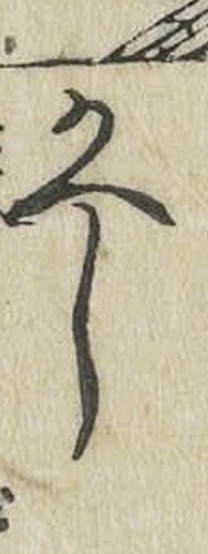かへし

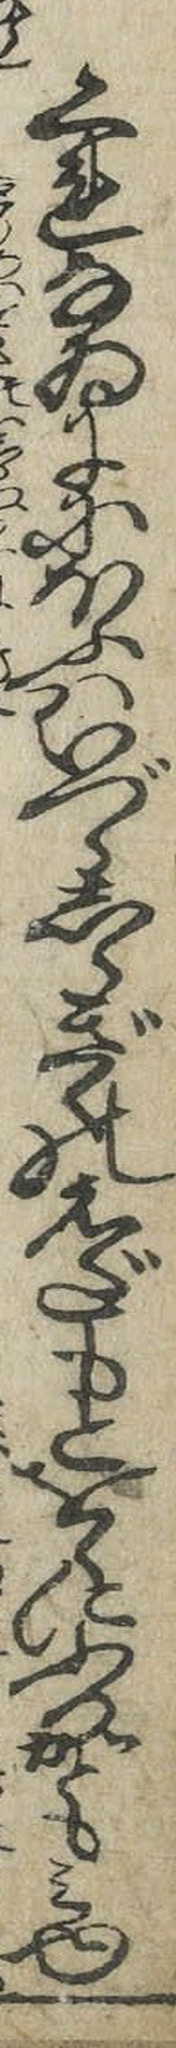くれなゐににほふはいづらしらぎくのえだもとをゝにふるかともみゆ
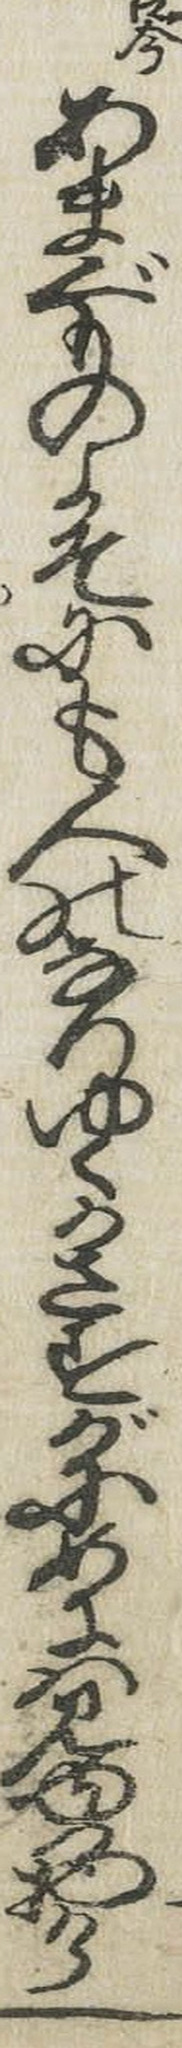古今あまぐものよそにも人のなりゆくかさすがにめには見ゆる物から
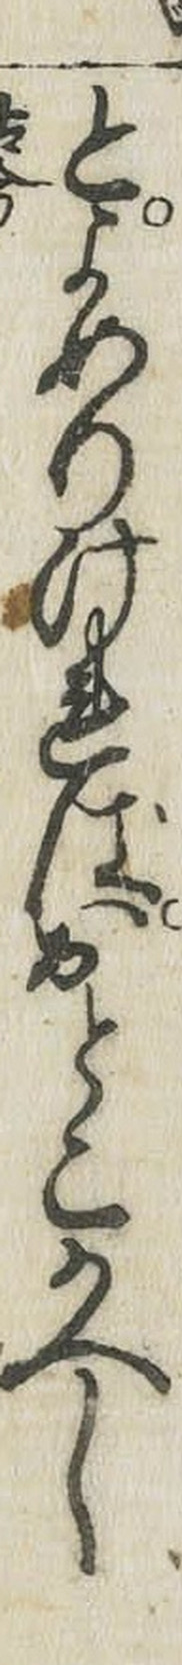と。よめりければ。おとこかへし
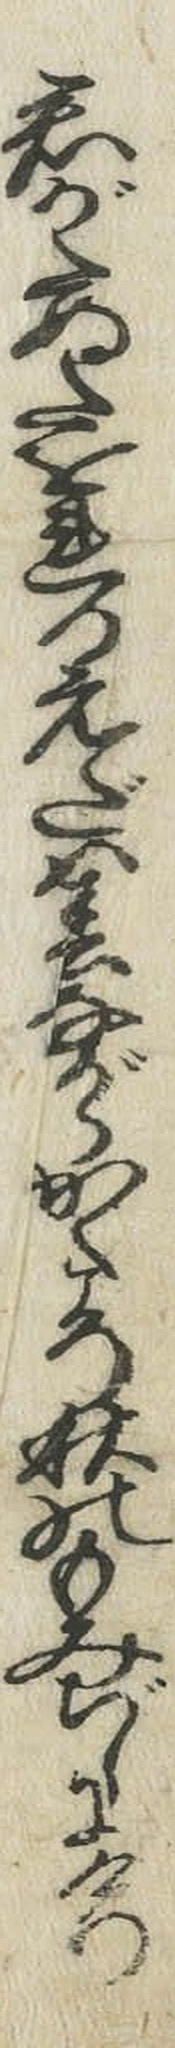君がためたをれるえだは春ながらかくこそ秋のもみぢしにけり
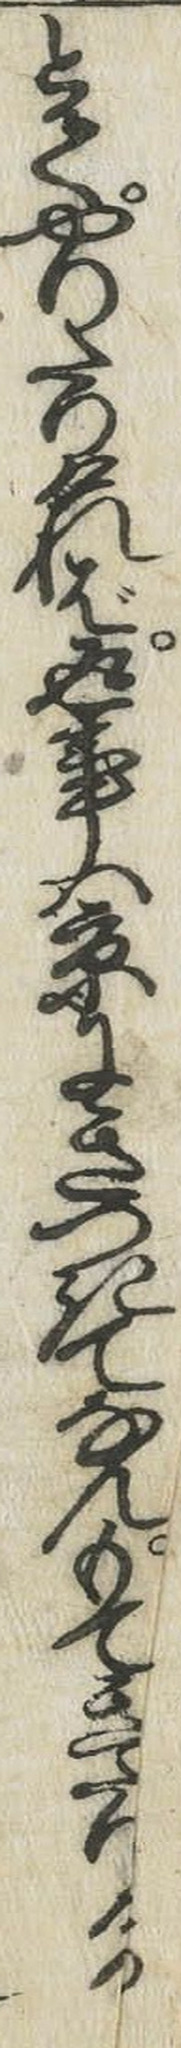とて。やりたりければ。返事は京にきつきてなん。もてきたりける
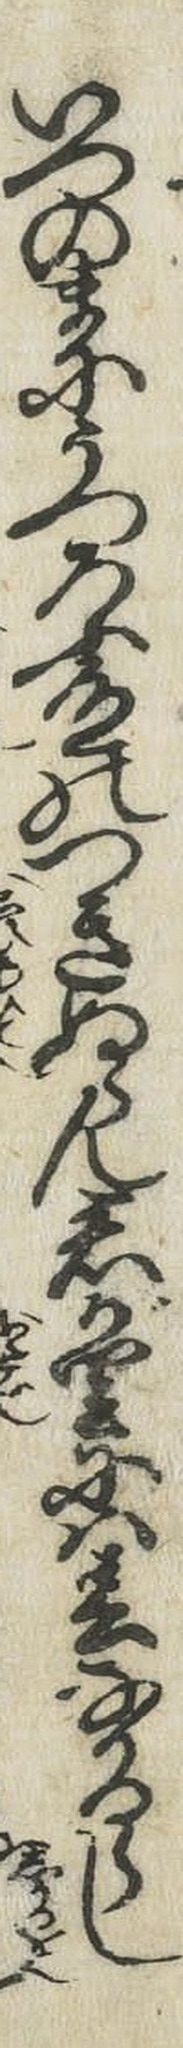いつのまにうつろふ色のつきぬらん君が里には春なかるらし
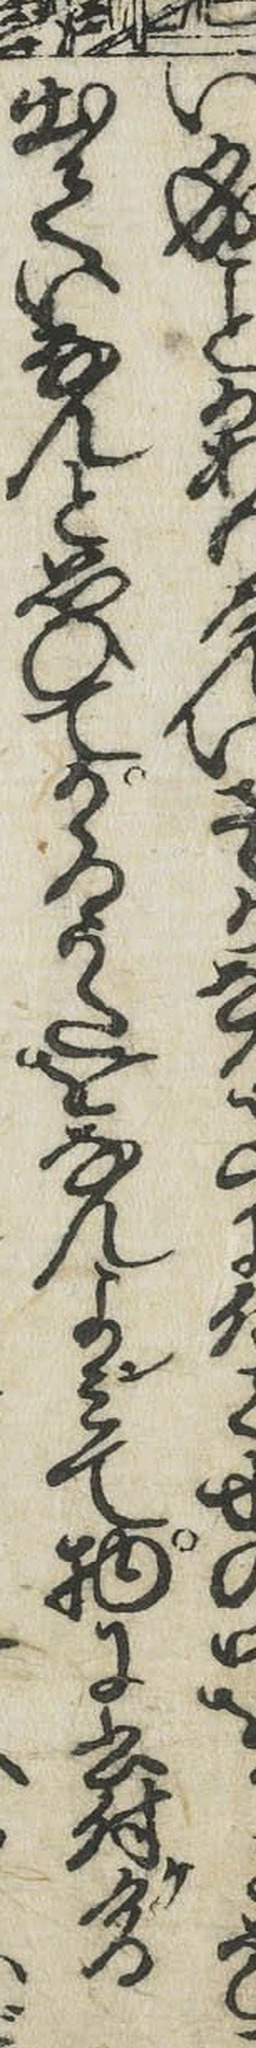出ていなんと思ひて。かゝるうたをなんよ。物に書付
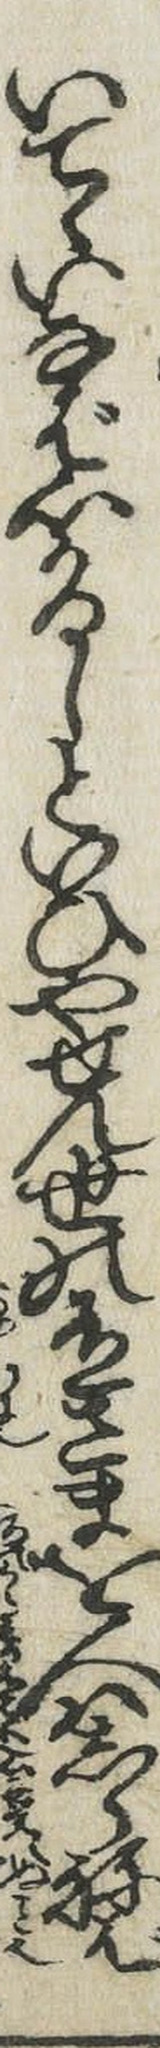いてゝいなば心かるしといひやせん世の有さまを人はしらねば
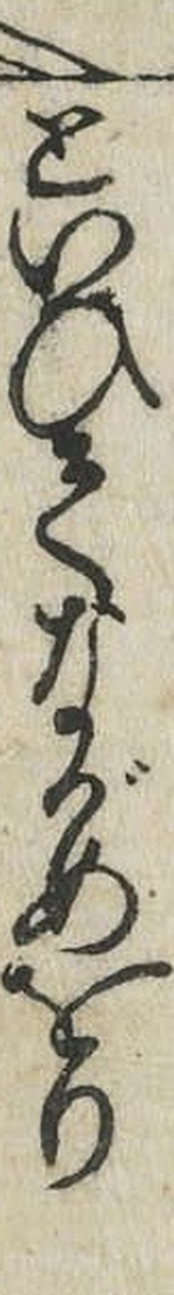といひてながめをり
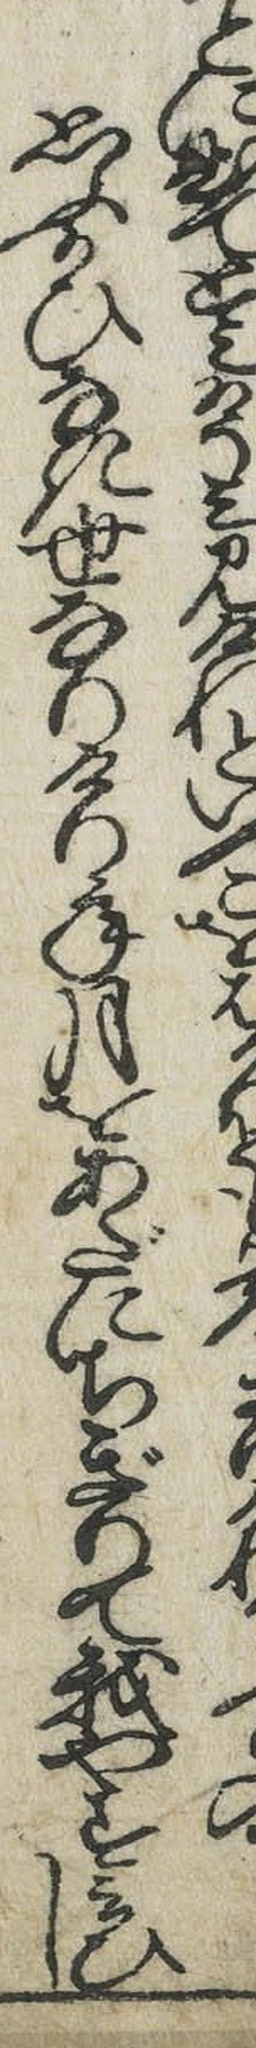思ふかひなき世なりけり年月をあだにちぎりて我やすまひし
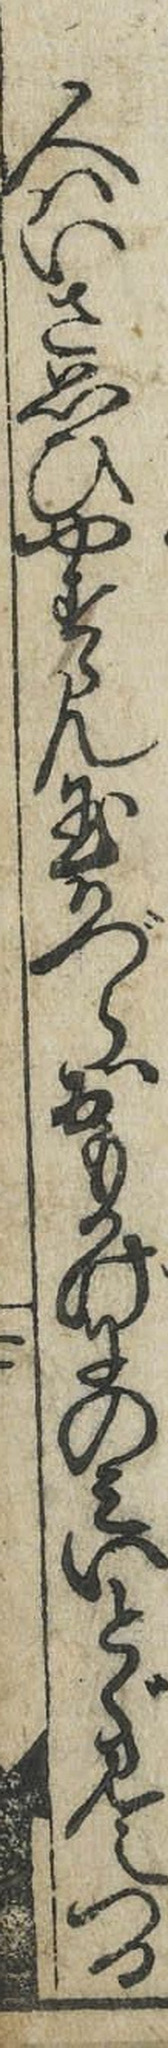人はいさ思ひやすらん玉かづらおもかげにのみいとゞ見えつつ

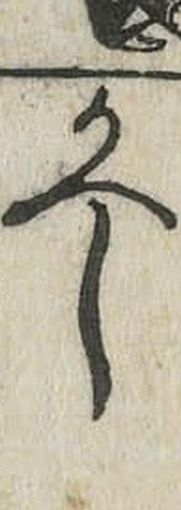かへし
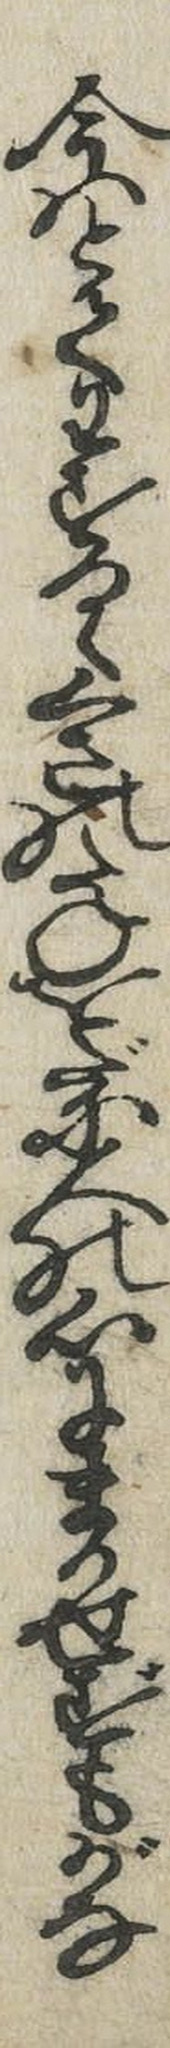今はとてわするゝくさのたねをだに人の心にまかせずもがな
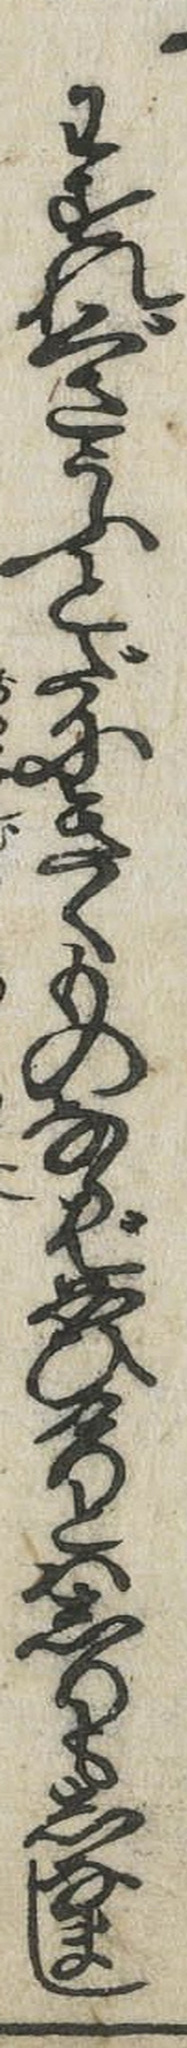わすれぐさうふとだにきくものならば思ひけりとはしりもしなまし
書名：新板絵入伊勢物語 : かうしやく付 2巻 上
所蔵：東京学芸大学教育コンテンツアーカイブ
